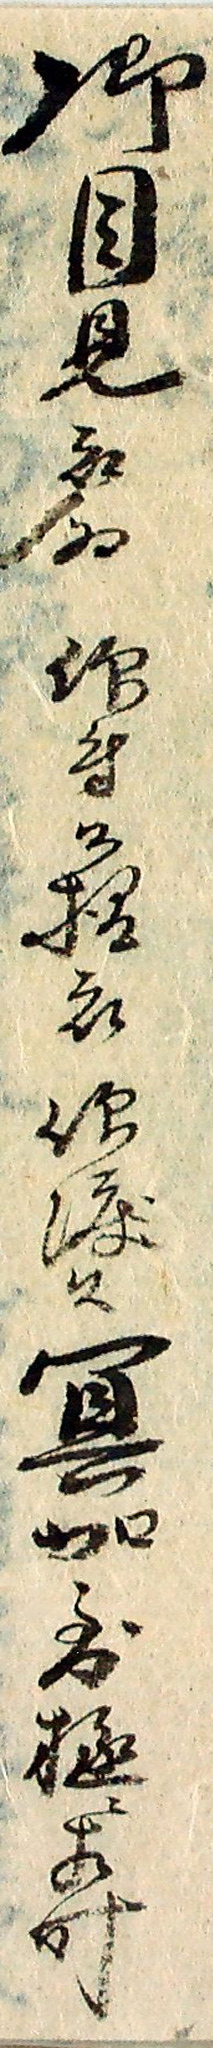御目見被為仰付候様被仰渡候冥加至極に相叶
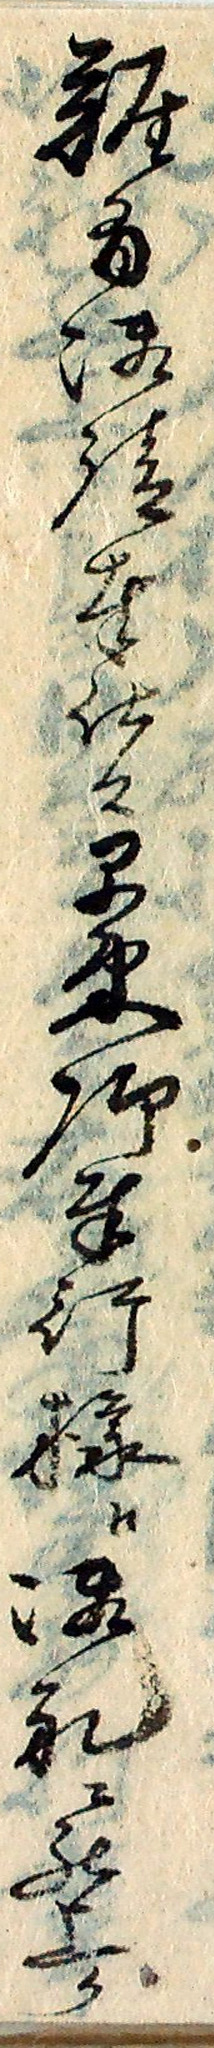難有御請奉仕候早速御奉行様え御礼に罷上り
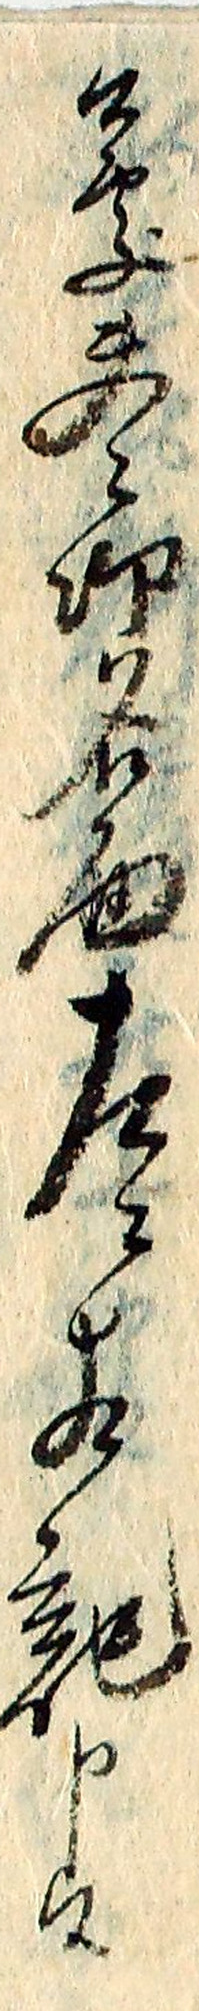候処夫々御名面左に相記申候
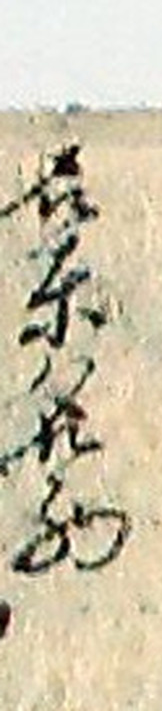名東名西
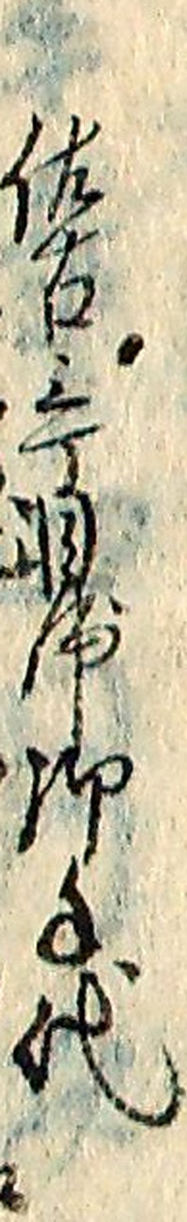佐古九丁目大浦御手代
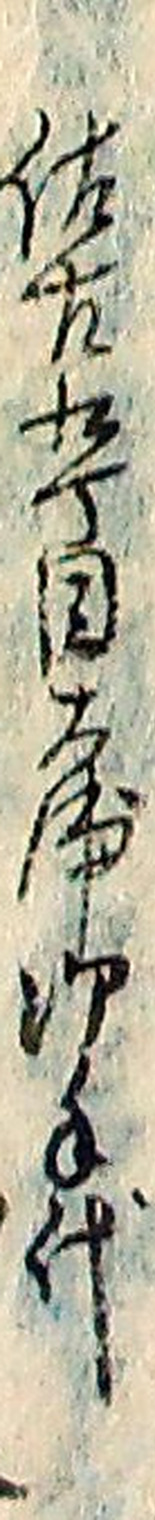佐古九丁目大浦御手代
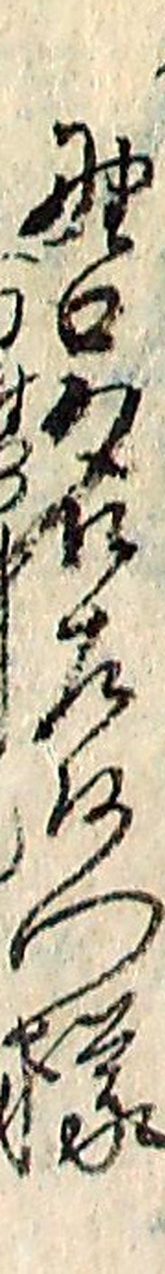野口名左衛門様
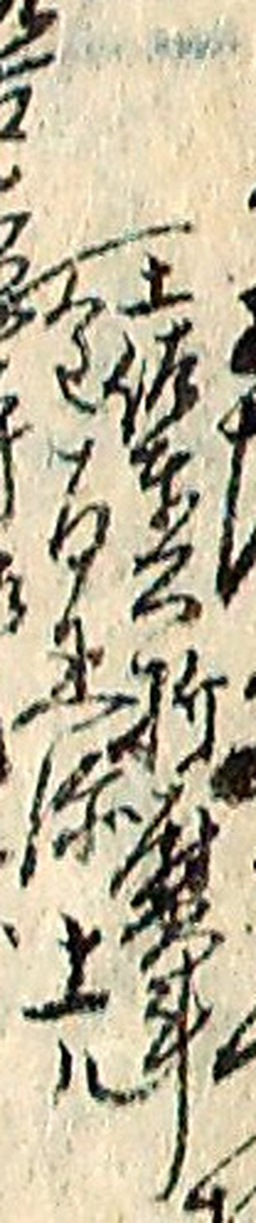金百疋添上る
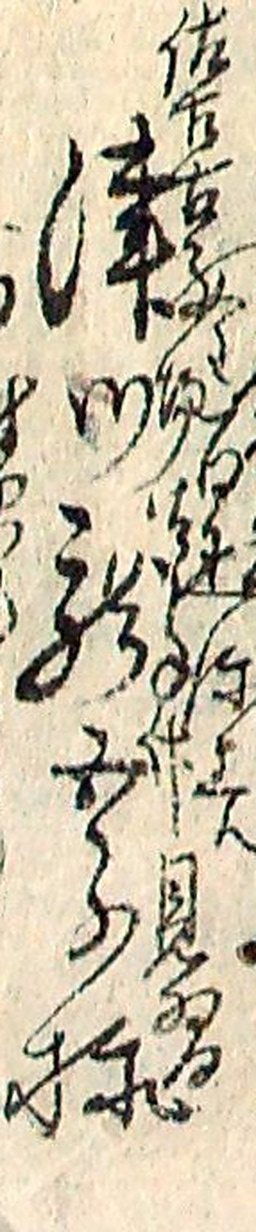津川龍五郎様
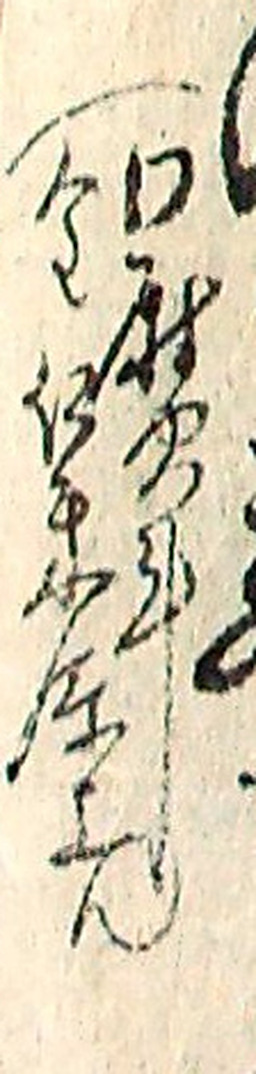金百疋添上る

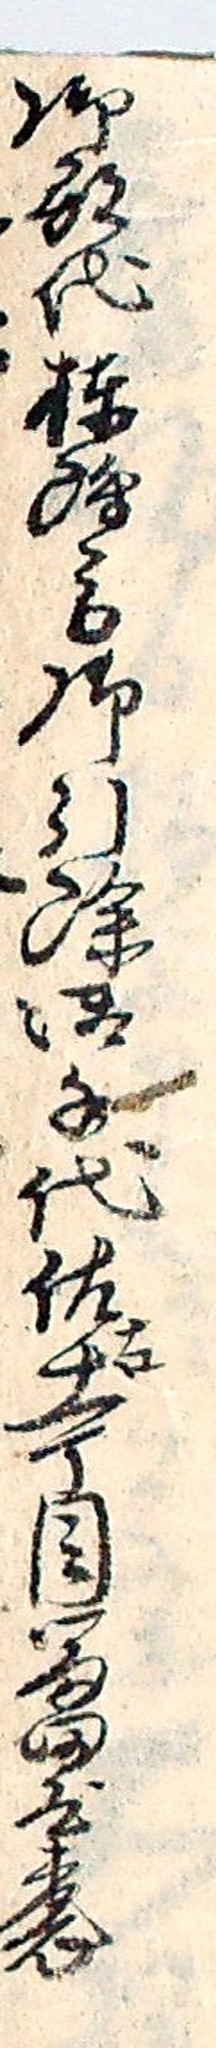御郡代棟附方御引除御手代佐古十一丁目富田屋裏
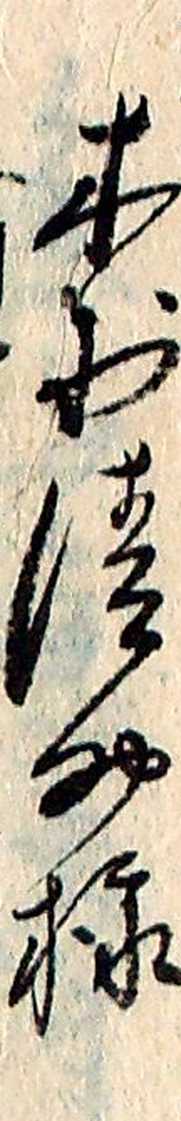木村清助様
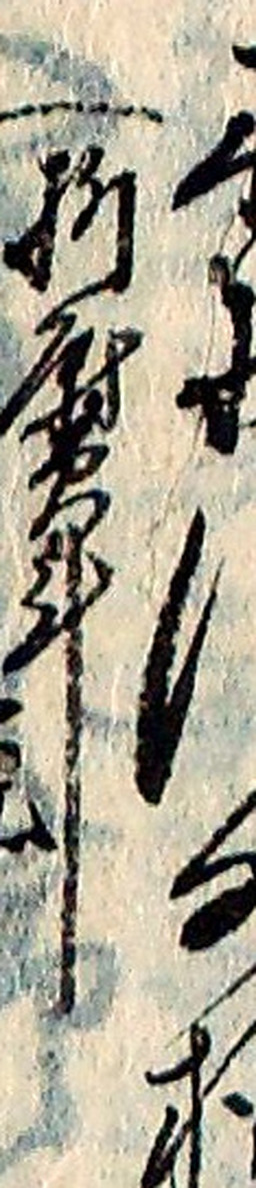折熨斗
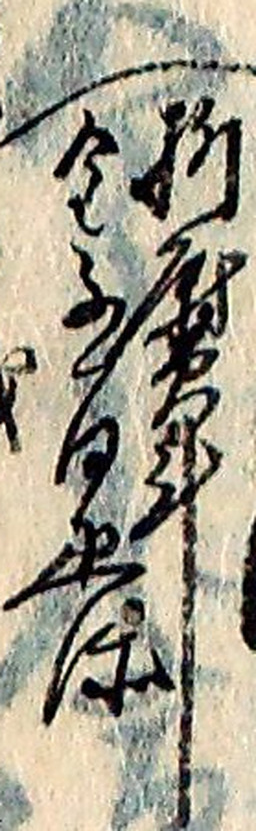金子百疋添
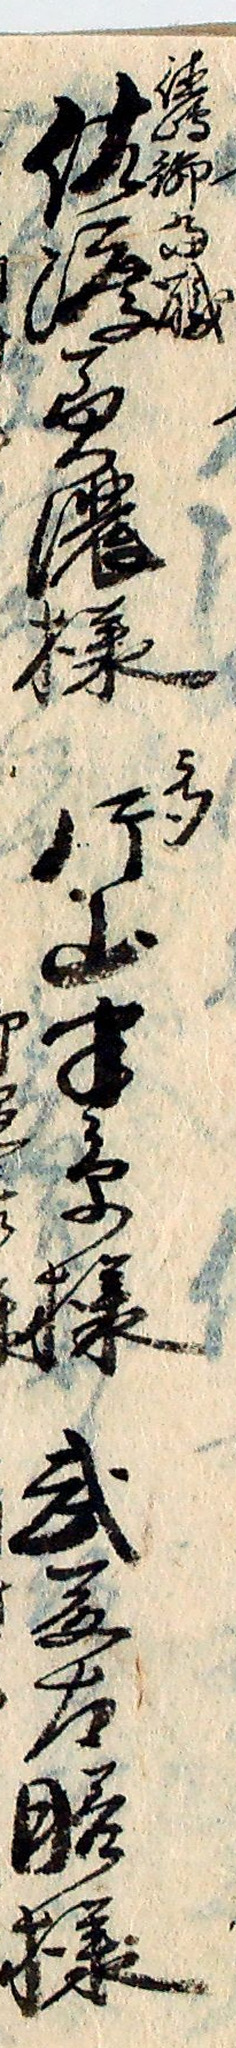佐渡美濃様片山半兵衛様武藤左膳様
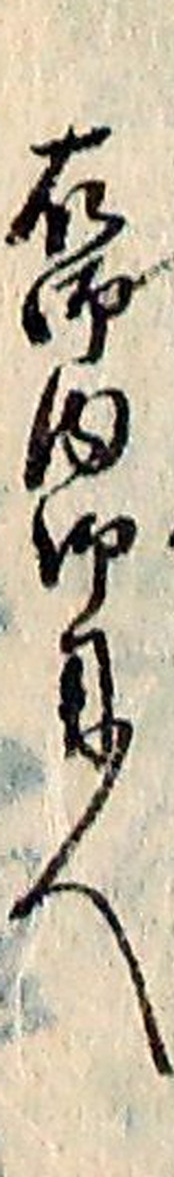右御内御目附
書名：諸御願書控(後藤氏壱番）
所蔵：鳴門教育大学 Naruto University of Education
